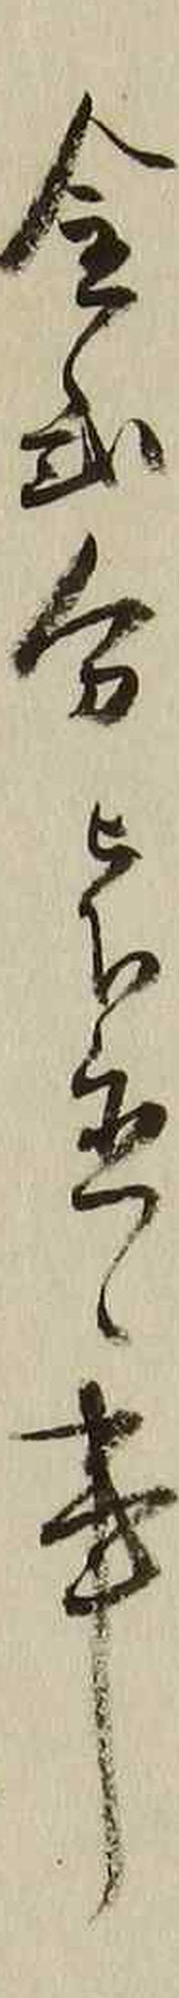金弐分被下置候事
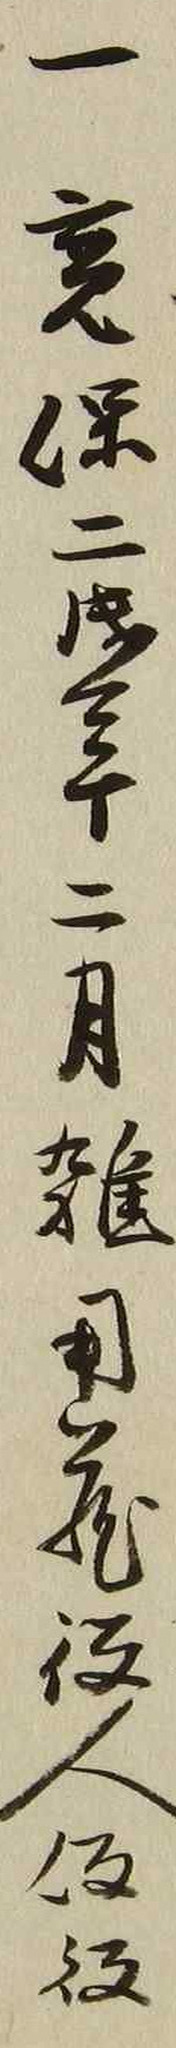一寛保二戌年二月雑用蔵役人仮役
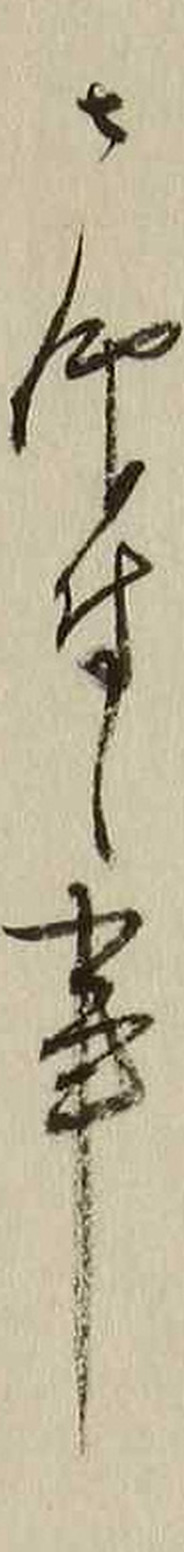被仰付候事
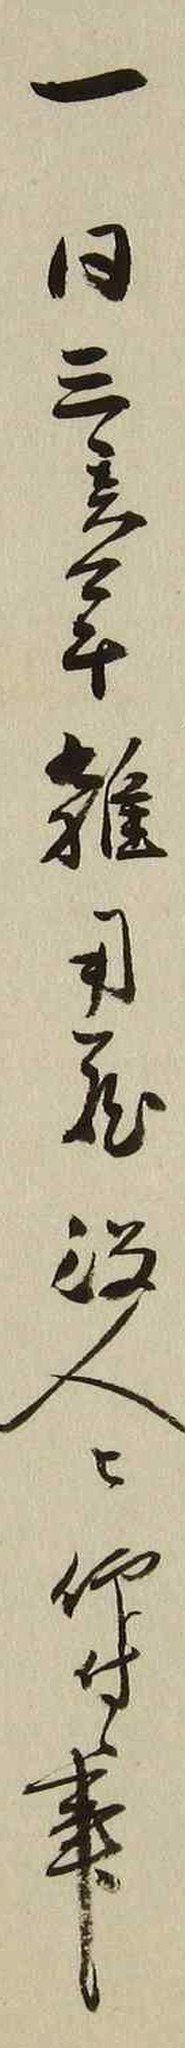一同三亥年雑用蔵役人被仰付候事
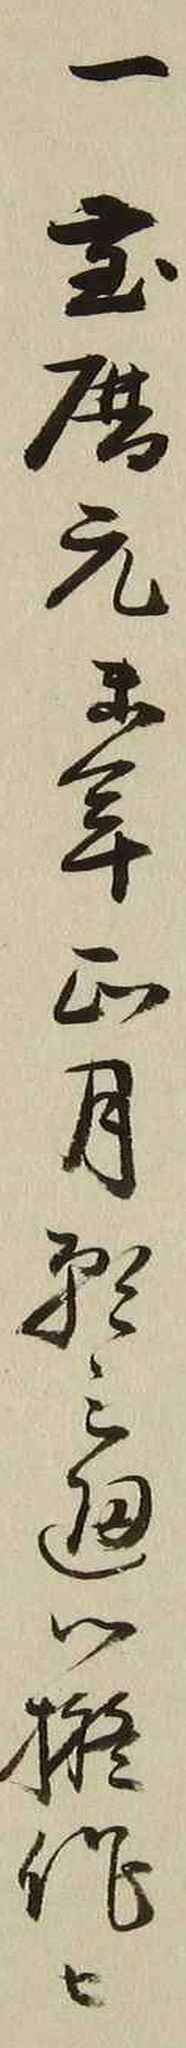一宝暦元未年正月願之通御擬作被
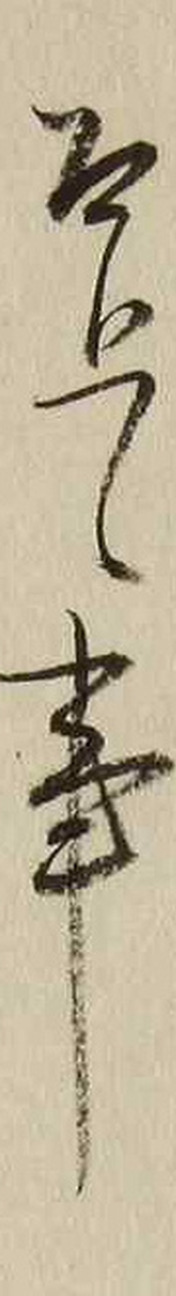召上候事
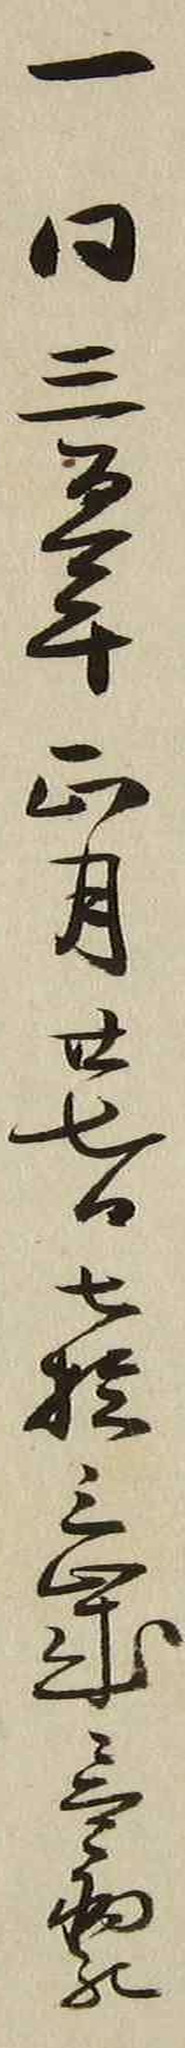一同三酉年正月廿七日七拾三歳ニ而病死
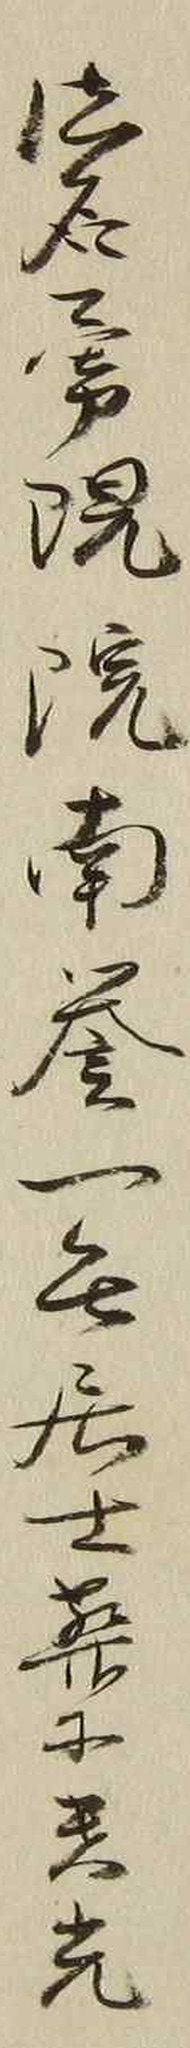法名勇現院南誉一無居士葬所貴光
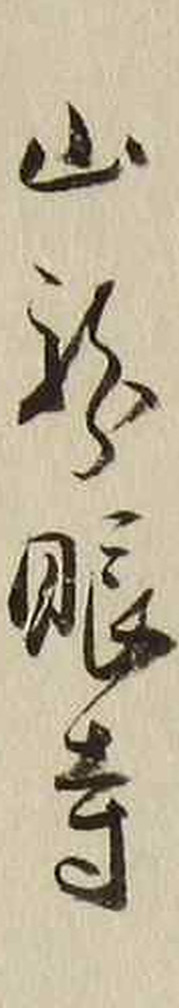山龍眼寺
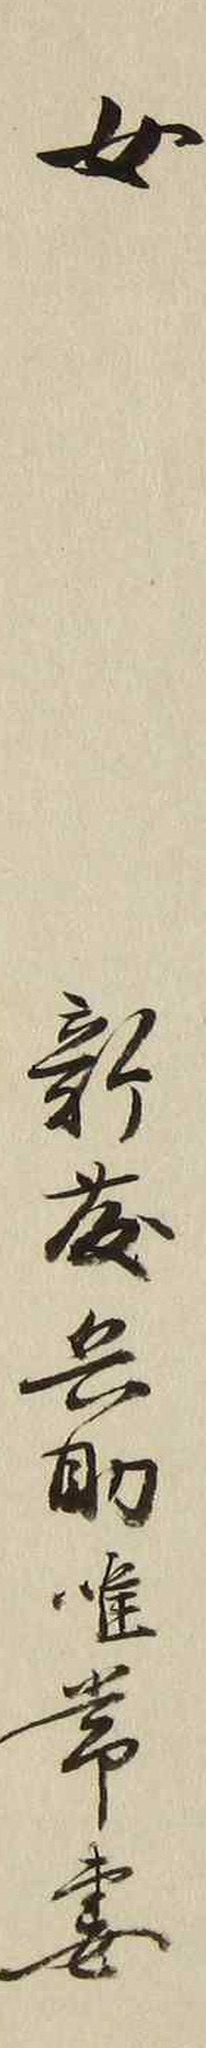女新藤兵助唯常妻
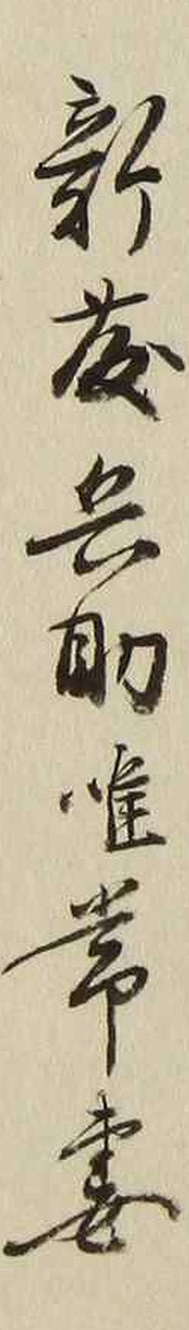女新藤兵助唯常妻
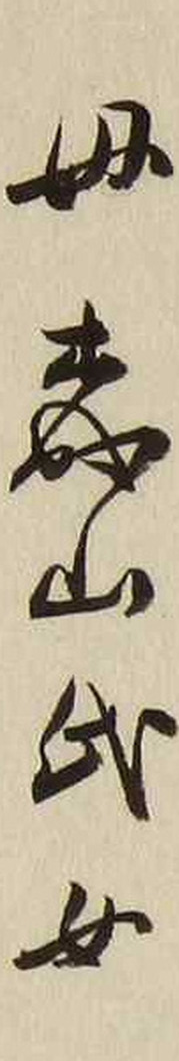母森山氏女

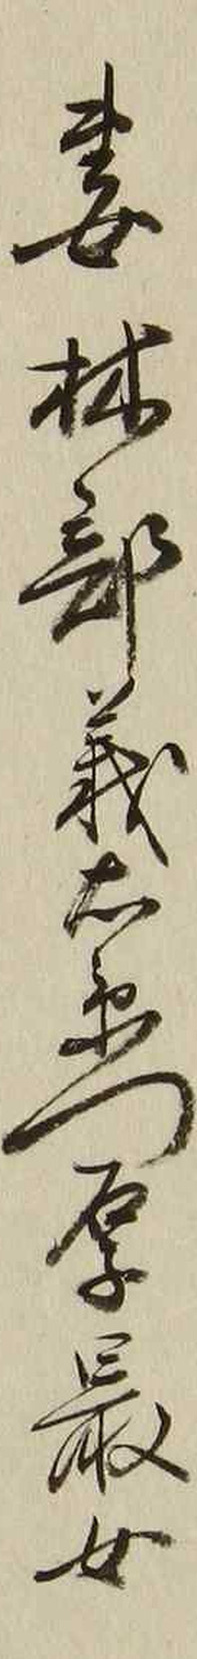妻林部義右衛門厚最女
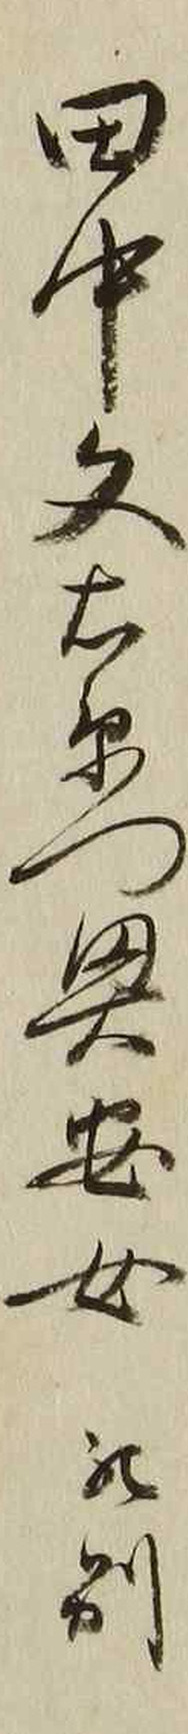田中文右衛門興安女死別
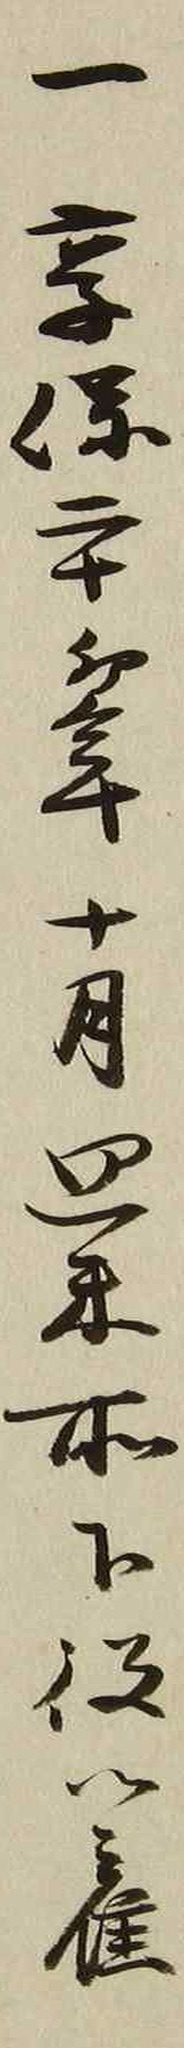一享保二十卯年十月廻米所下役御雇
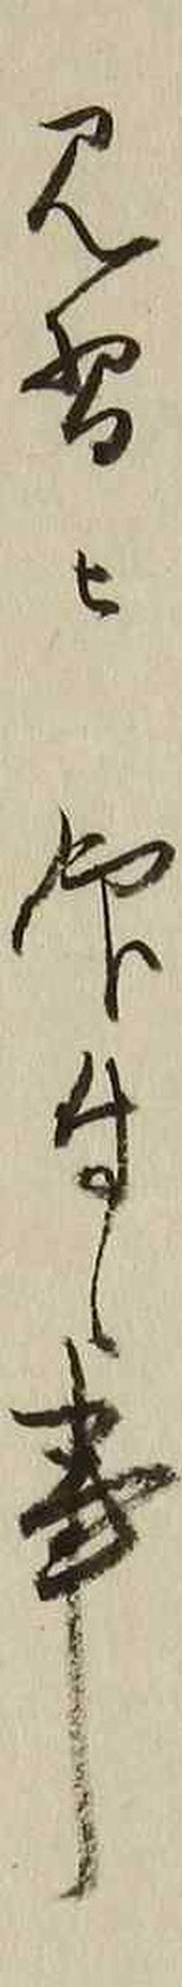見習被仰付候事
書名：諸士系譜　巻之288　さ之部20
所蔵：会津若松市立会津図書館
